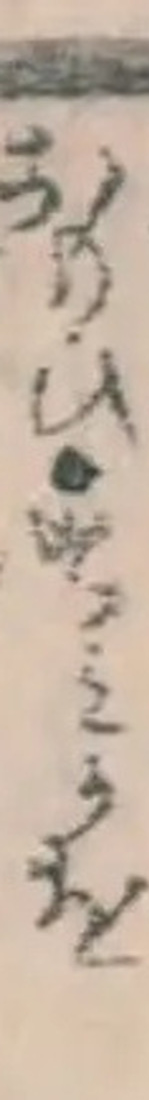おもひすみかを
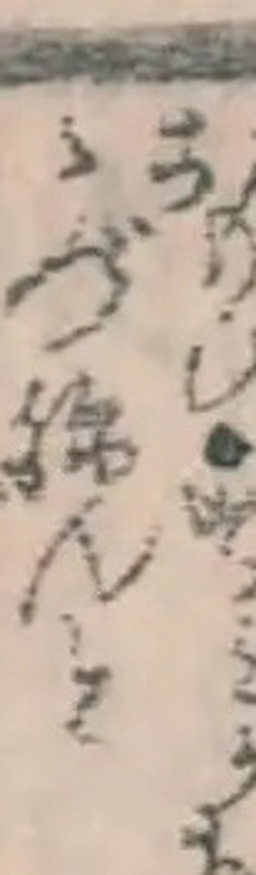たづねんと
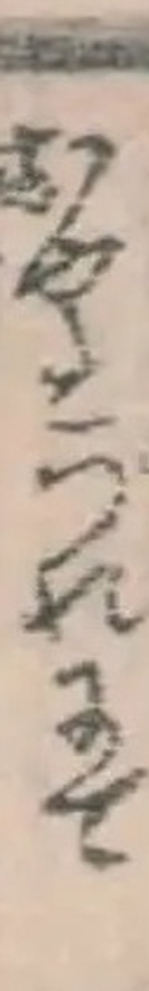おやこづれにて
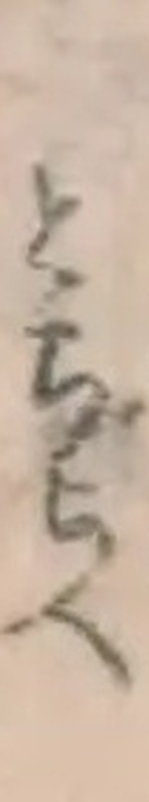とちらへ
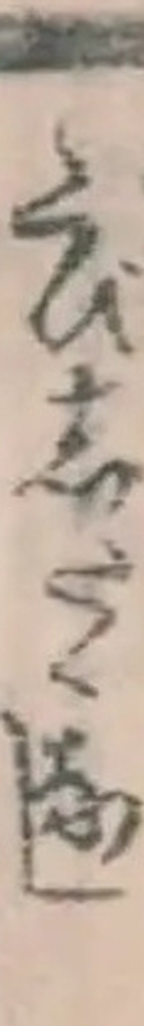たびしたくなし
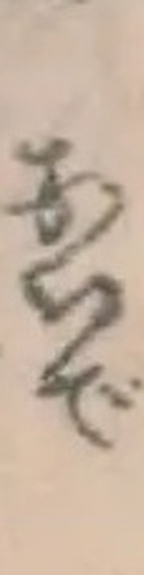おいで
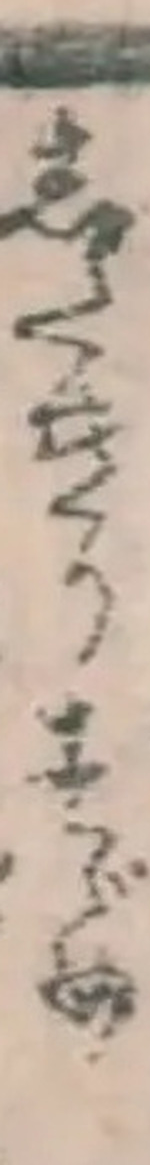したきりすゞめ
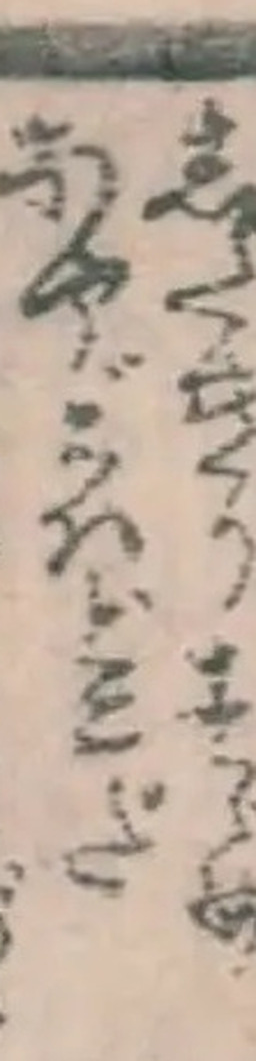おやどはどこだ
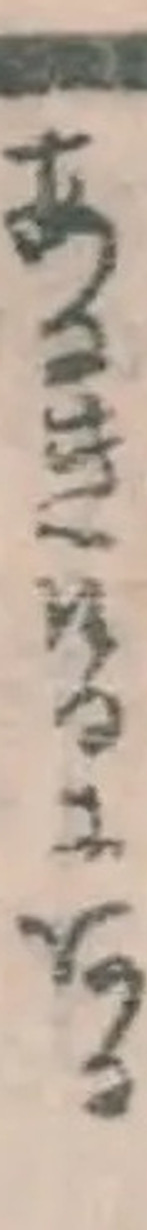あるきけるにある
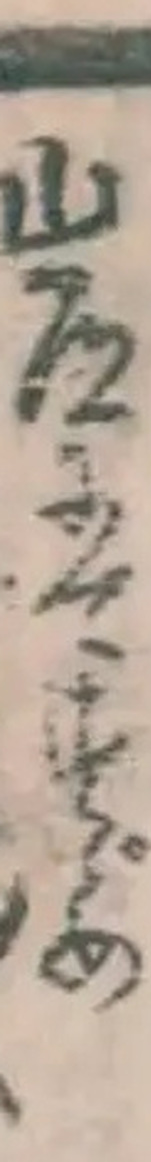山道にてすゞめ
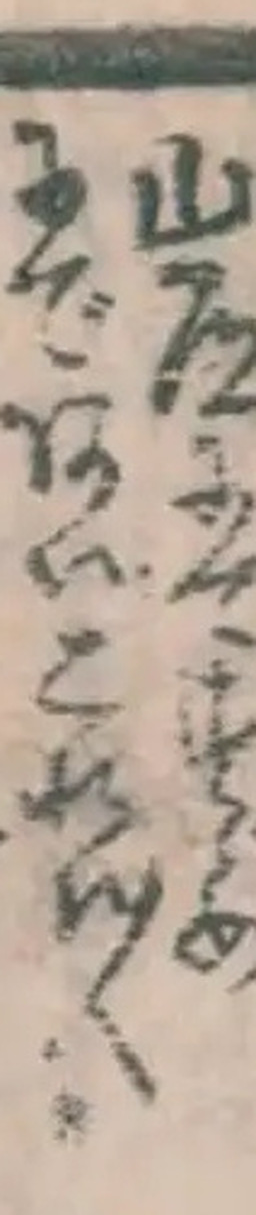にであいこれは〳〵
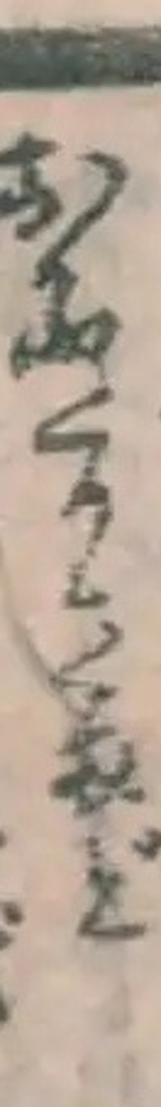おふたりさまど
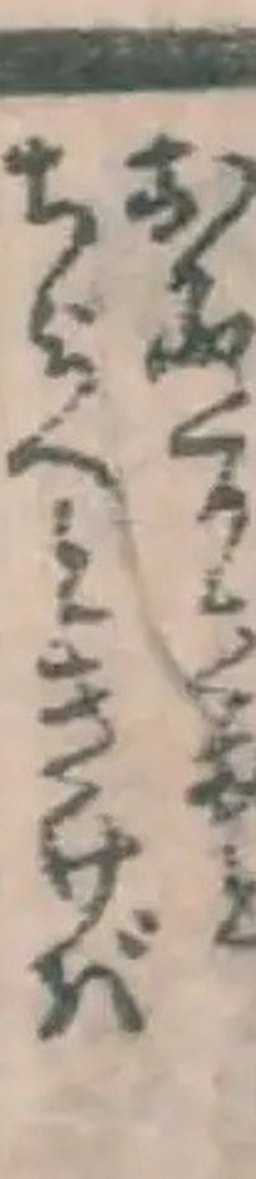ちらへときけば
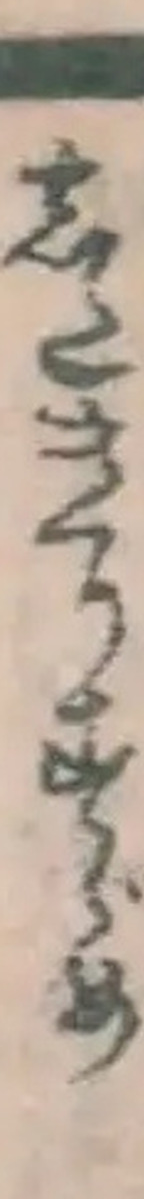したきりすゞめ

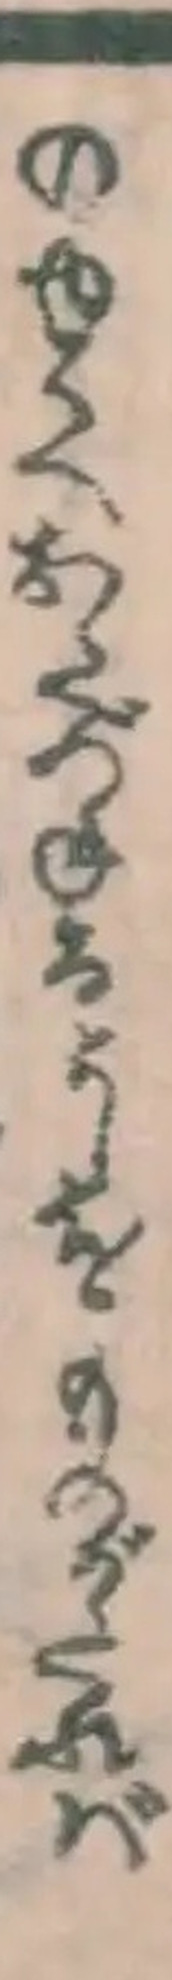のゆくへおたづねるよしをものがたれば
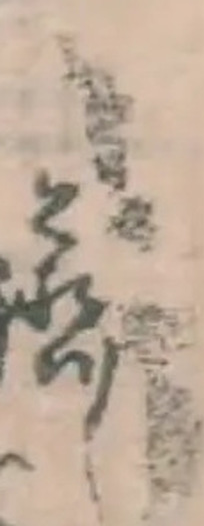こゝは
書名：舌切雀
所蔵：国立国会図書館 National Diet Library, JAPAN
